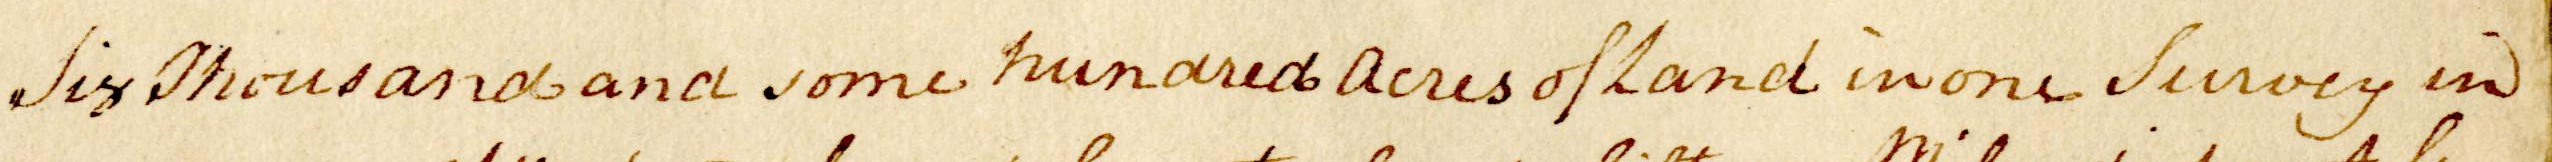Six thousand and some hundred acres of land in one Survey in
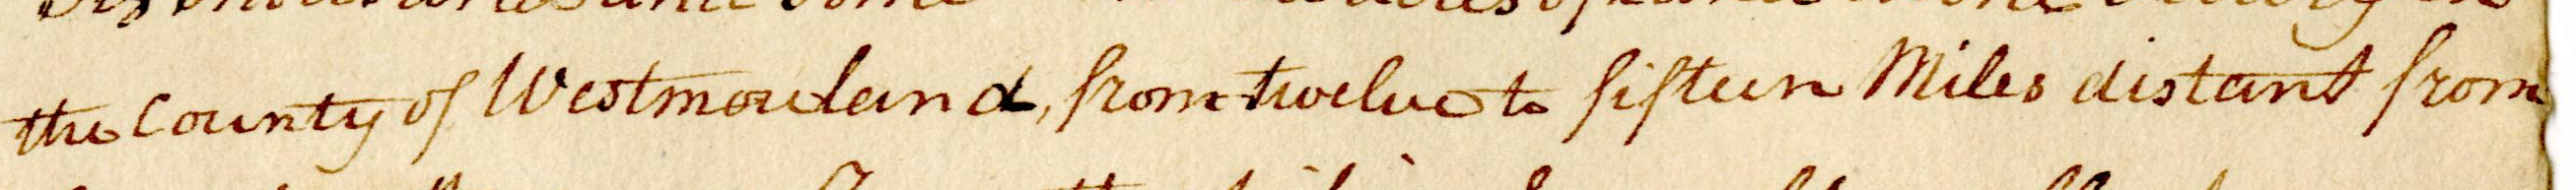the county of Westmoreland, from twelve to fifteen Miles distant from
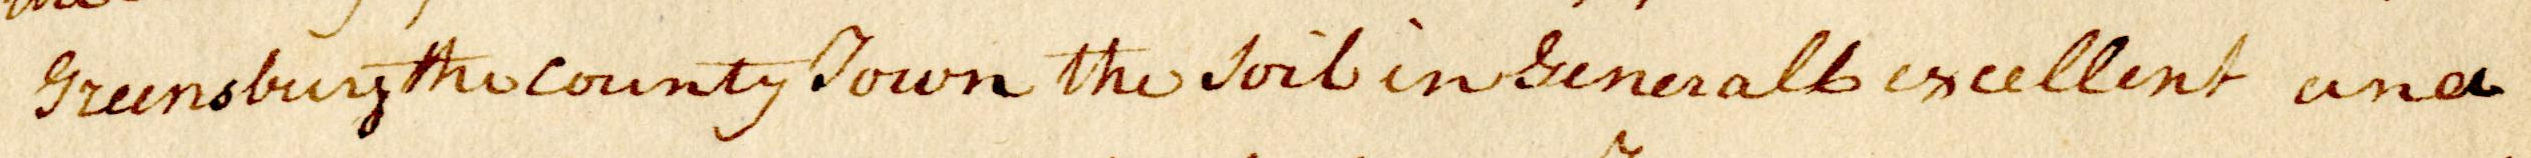Greensburg the county Town the Soil in Generall excellent and
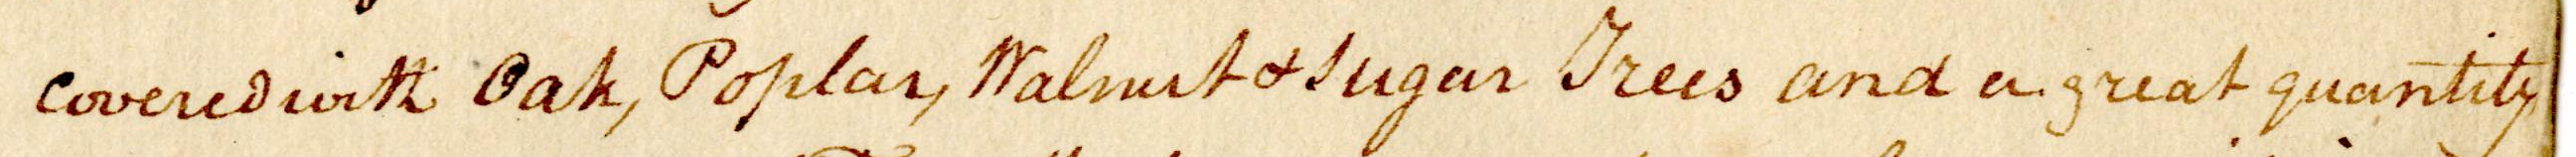covered with Oak, Poplar, Walnut & Sugar Trees and a great quantity
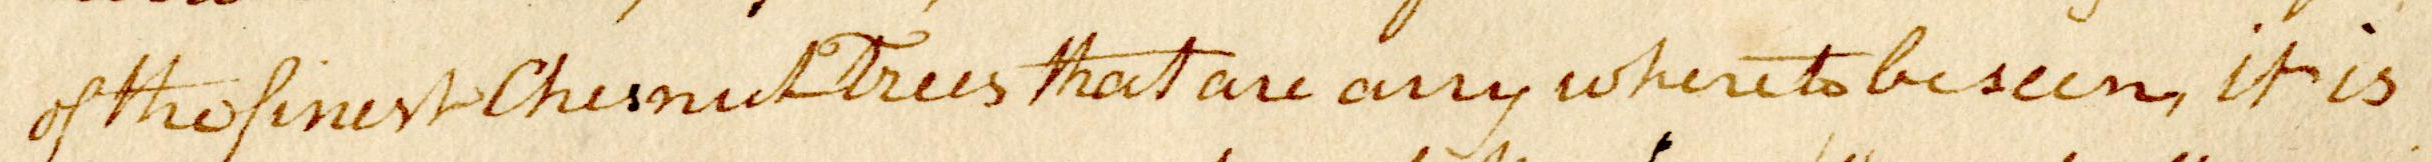of the finest Chesnut trees that are any whereto be seen, it is
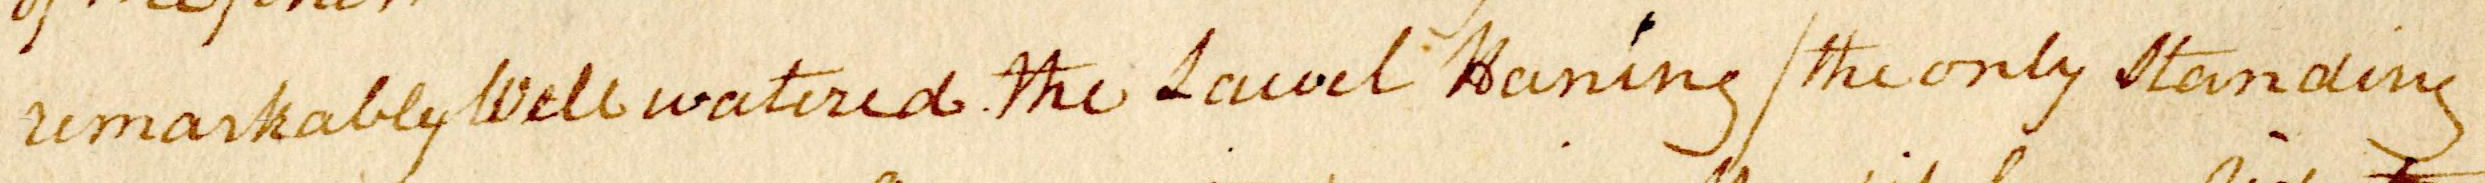remarkably well watered the Lawel Haning / the only Standing
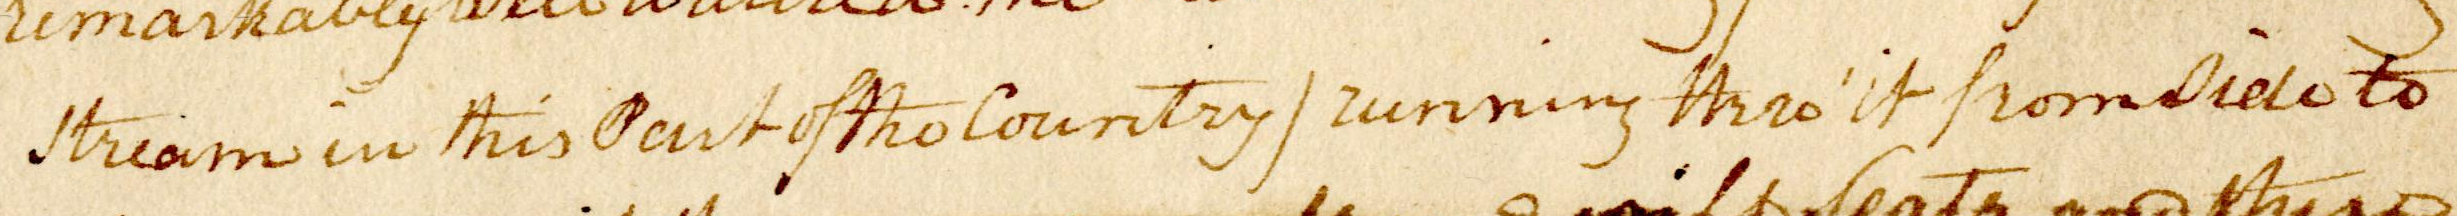Stream in this Part of the Country / running thro' it from side to
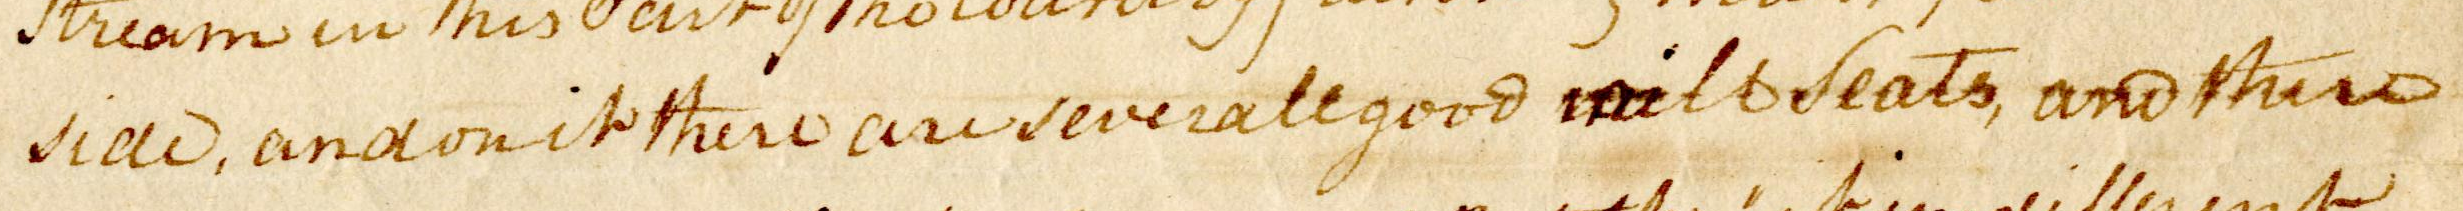side, and on it there are severall good milt seats, and there
